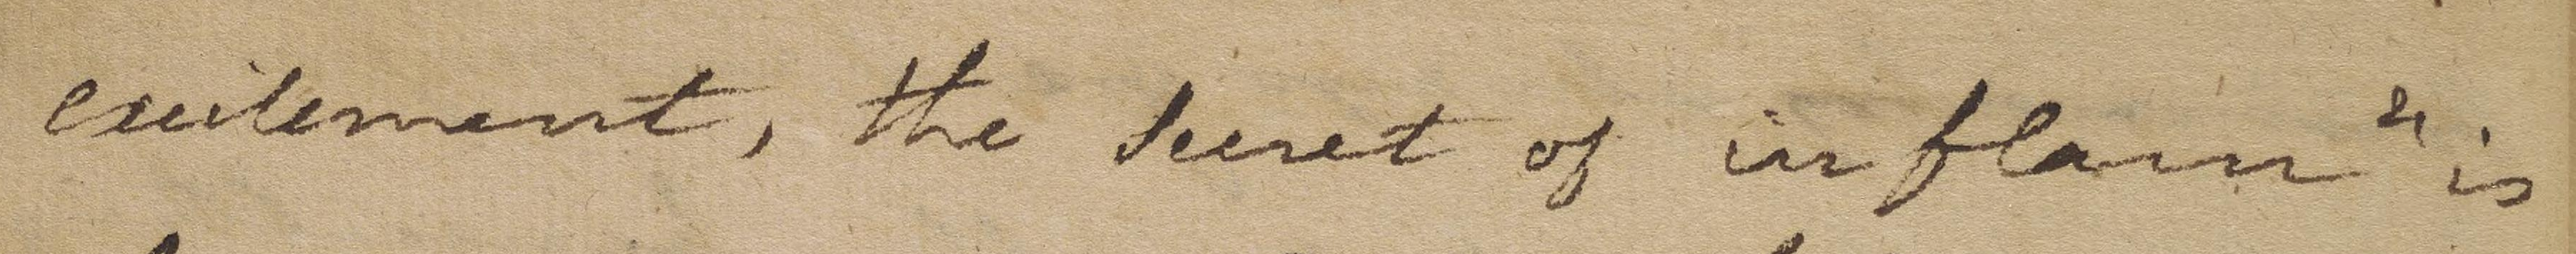excitement, the secret of inflam^n is
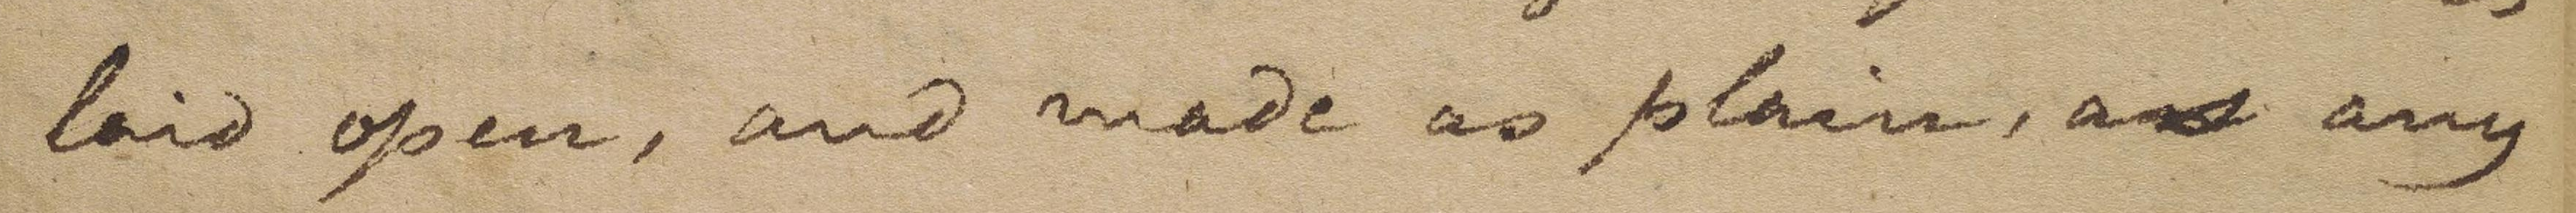laid open, and made as plain, as any
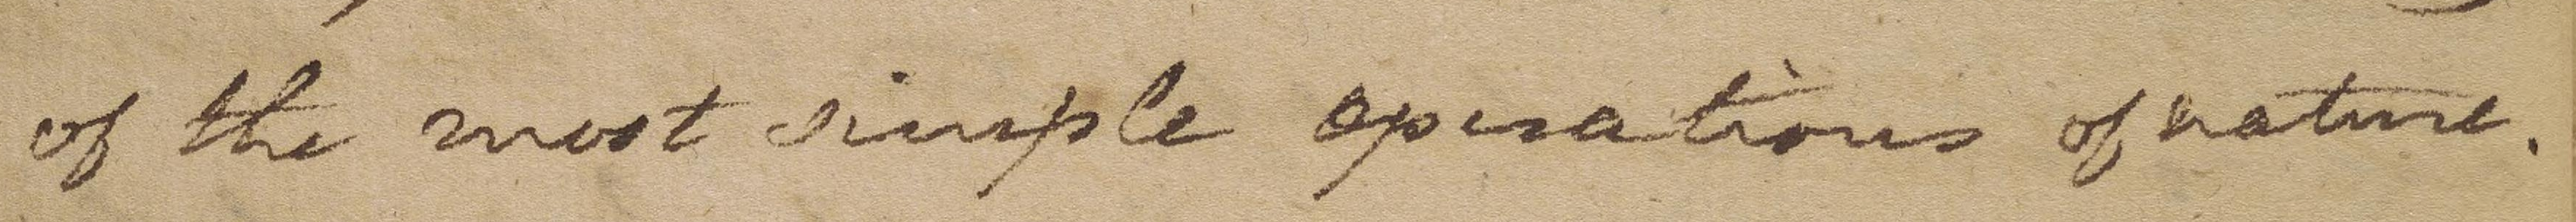of the most simple operations of nature.
